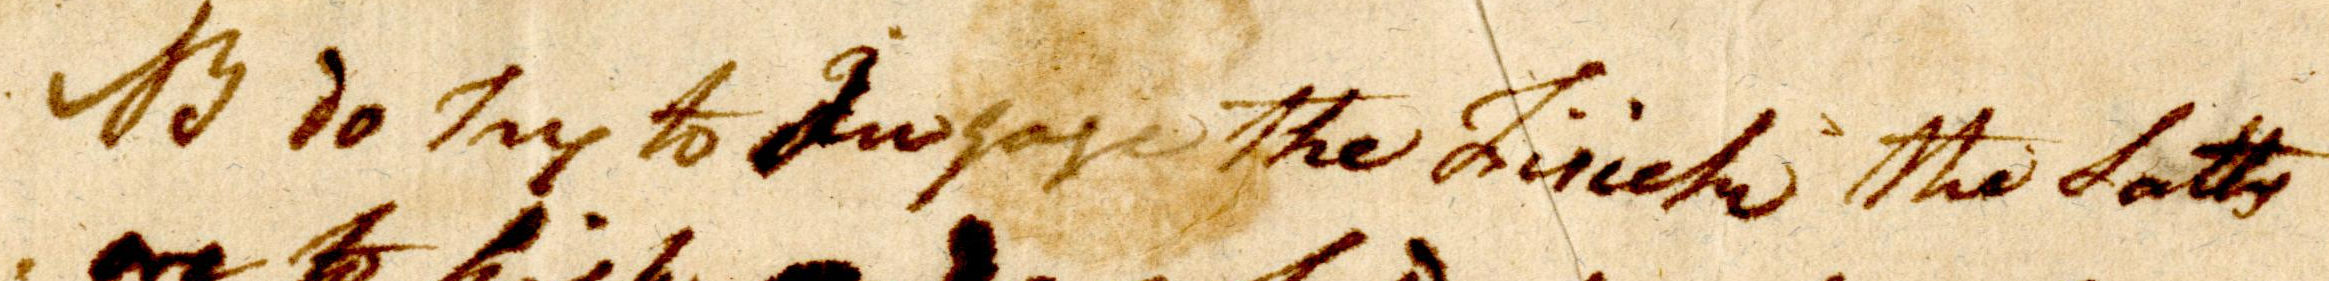NB do try to Ingage the Tisick the Lotts
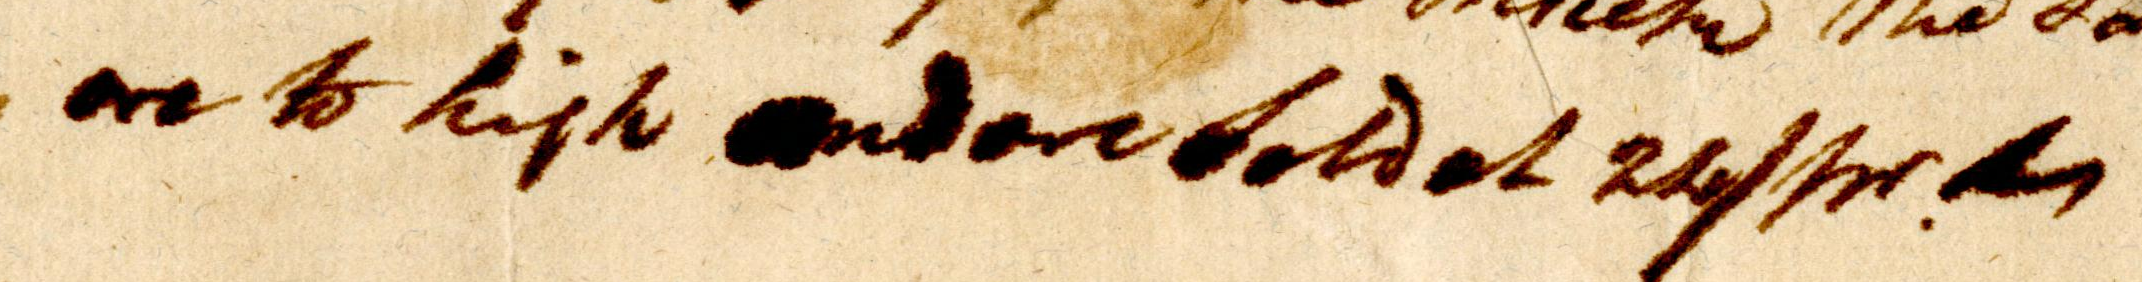are to high and are sold at 24s p^r.
